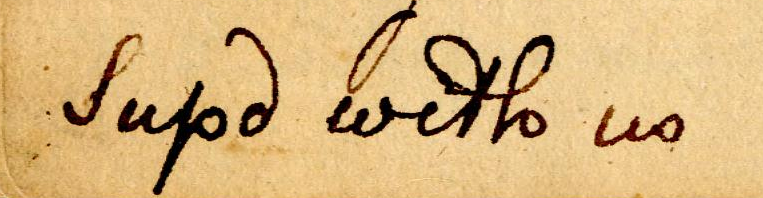Supd with us -
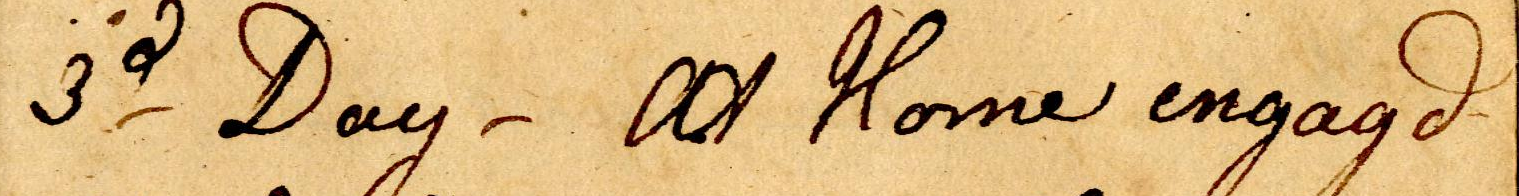3^d Day- At Home engagd
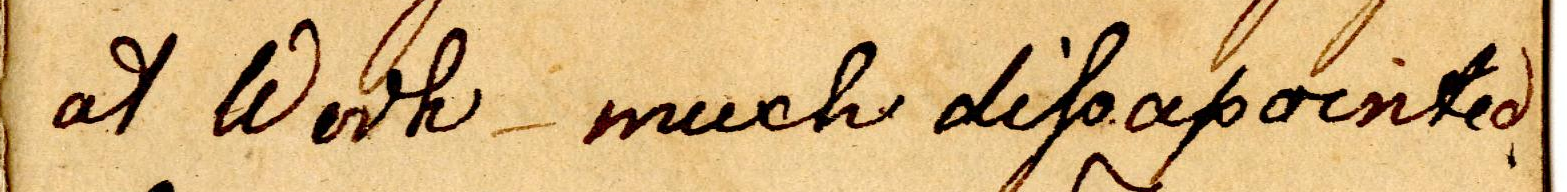at Work- much dissapointed
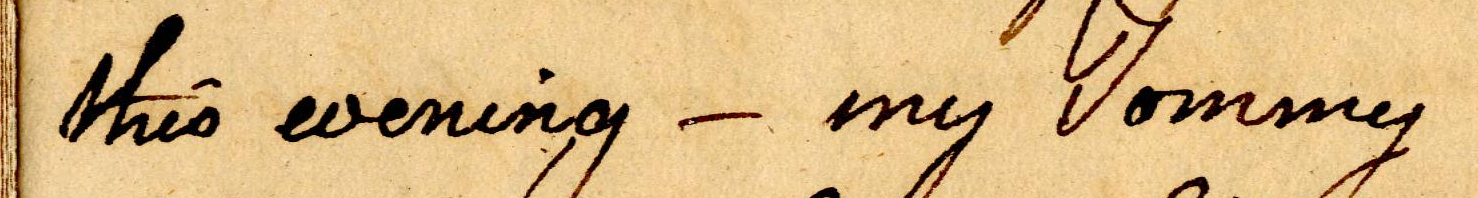this evening- my Tommy
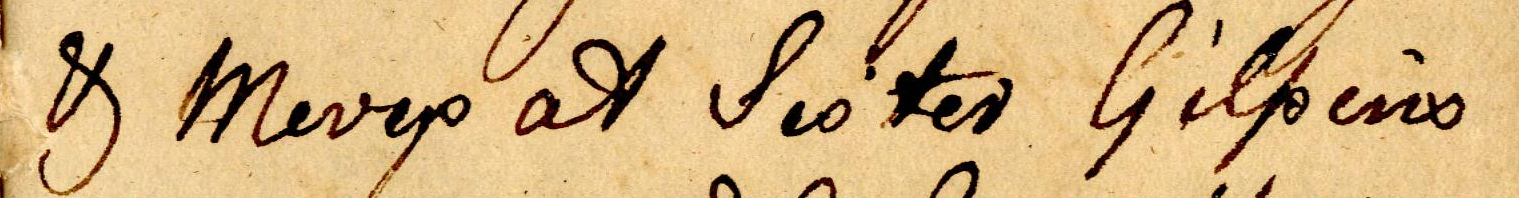& Merys at Sister Gilpins
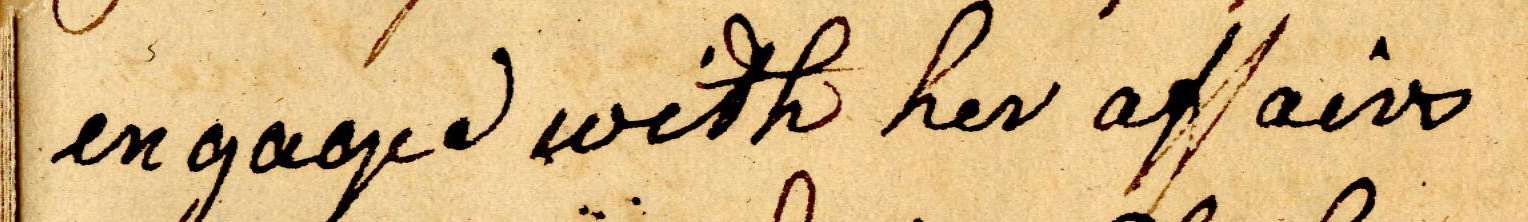engaged with her affairs
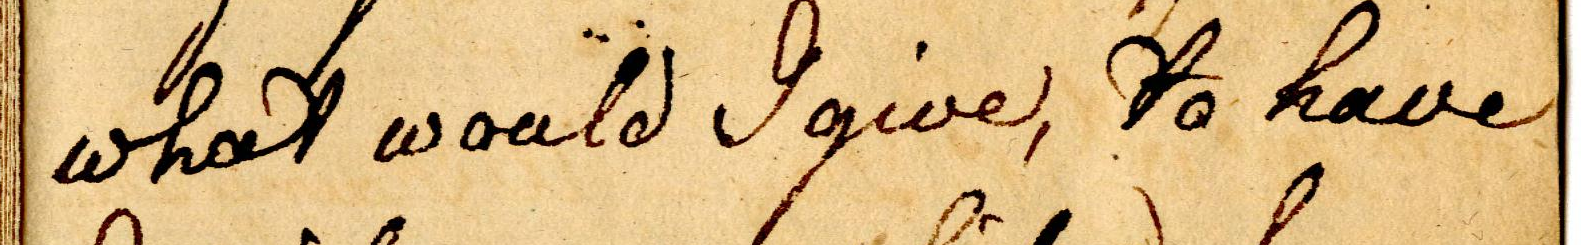what would I give, to have
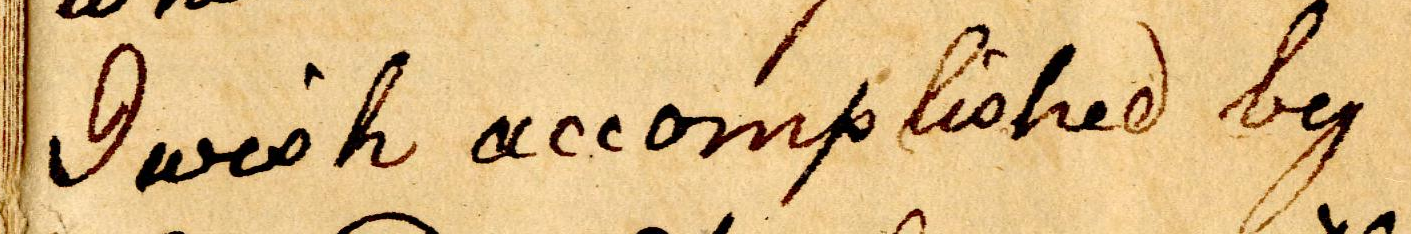I wish accomplished by
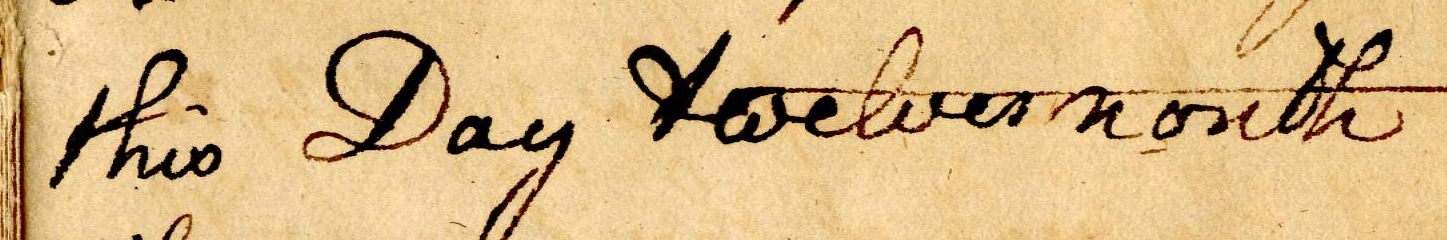this Day twelvemonth
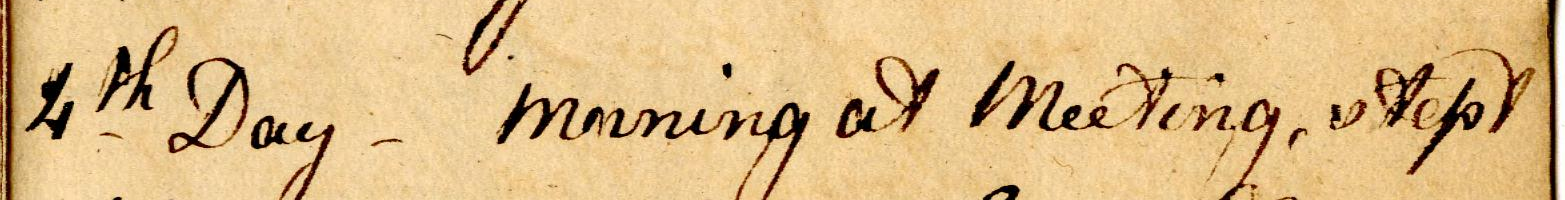4^th Day- morning at Meeting, stept
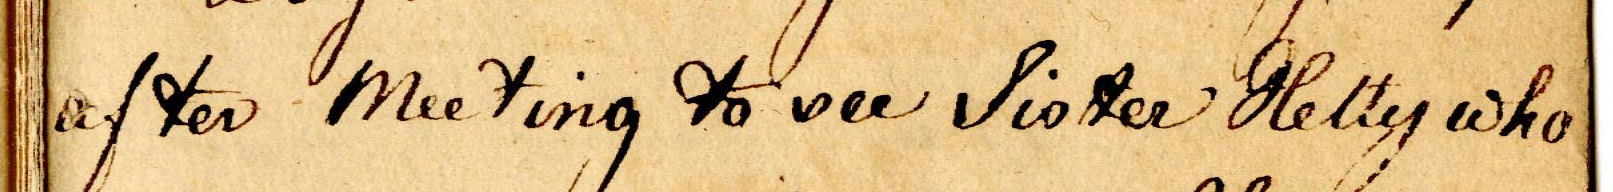after, Meeting to see Sister Hetty who
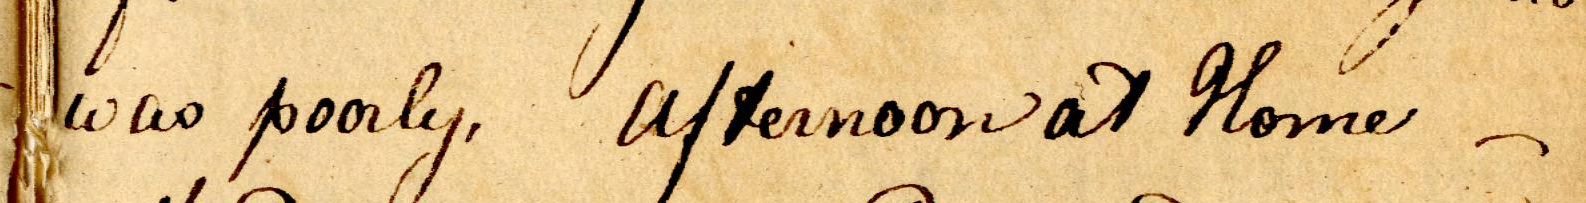was poorly, Afternoon at Home-
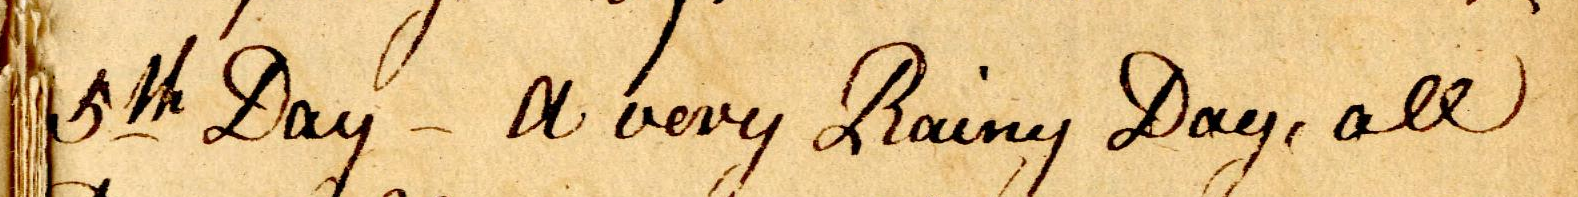5^th Day- A very Rainy Day, all
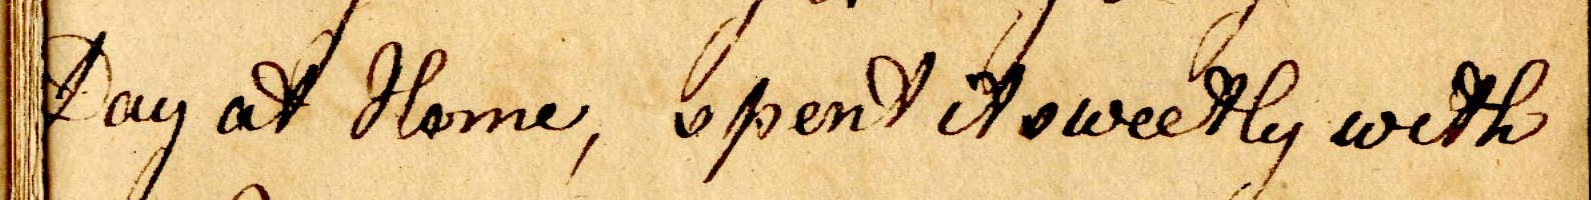Day at Home, spent it sweetly with
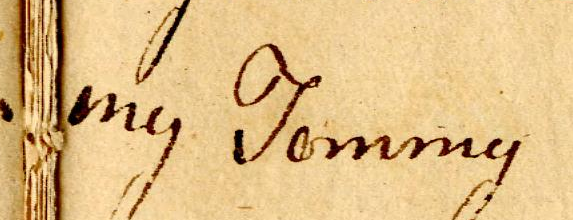My Tommy -
